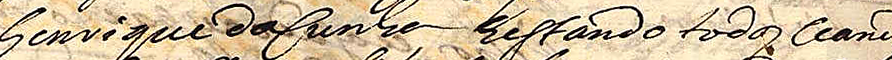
henrique da Cunha – E estando todos ceando
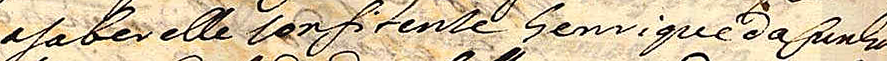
a saber elle confitente henrique da Cunha
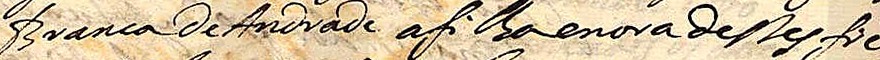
Branca de Andrade a filha e nora destes frco
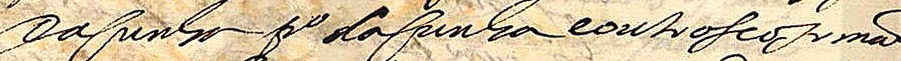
da Cunha po da Cunha e outro seo jrmão
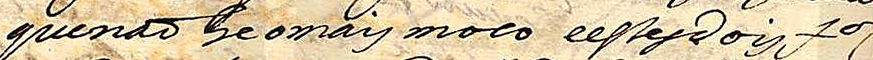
que naõ he o mais moco e estes dois fos
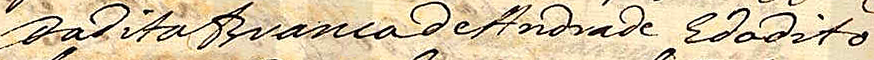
da dita Branca de Andrade E do dito
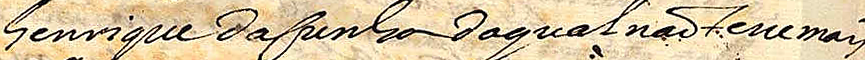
henrique da Cunha do qual não teue mais
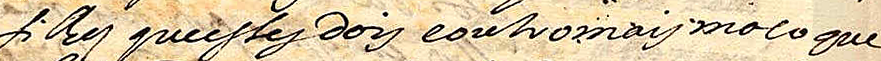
filhos que estes dois e outro mais moco que
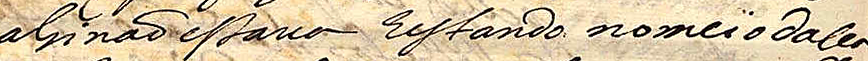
ahi não estaua E estando nomeio da cea
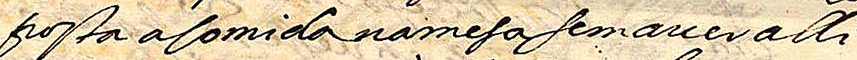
posta a Comida na mesa sem auer alli
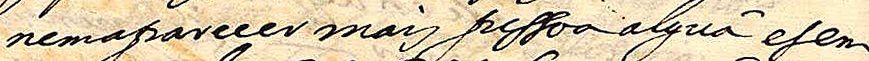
nem aparecer mais pessoa alguā e sem
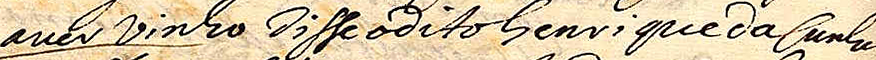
auer vinho disse o dito henrique da Cunha
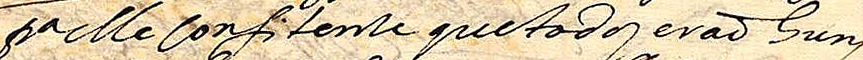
pa elle Confitente que todos eraõ huns
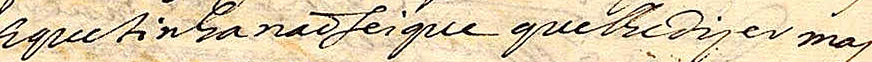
E que tinha naõ sei que quer lhe dizer mas
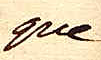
que
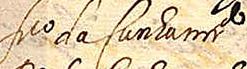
frco da Cunha mrdo
